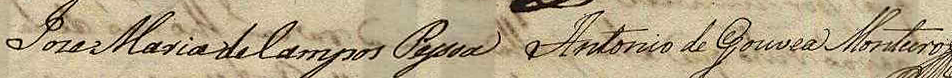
Ioze Maria de Campos Pessoa Antonio de Gouvea Monteiro
